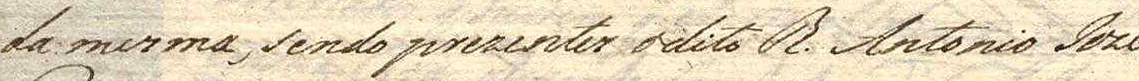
da mezma, sendo prezentes o dito R. Antonio Iozé
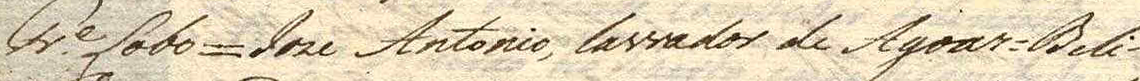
Fr.e Lobo = Ioze Antonio, lavrador de Agoaz= Beli
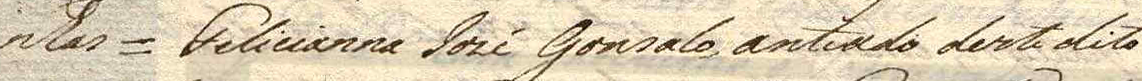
nhas - Felicianna Iozé Gonsalo anteado dezte dito
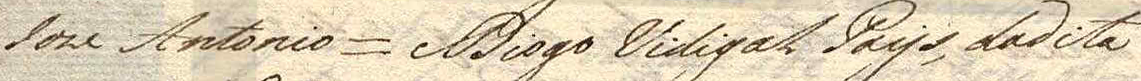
Ioze Antonio = Diogo VidigaL Pays, da dita
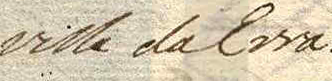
villa da Erra.
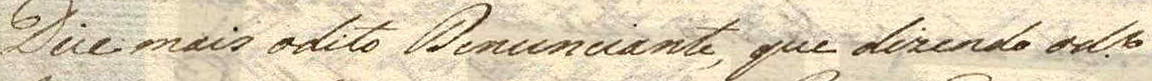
Dice mais o dito Denunciante, que dizendo o d.o
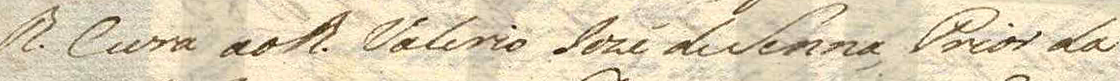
R. Cura ao R. Valerio Iozé de Senna, Prior da
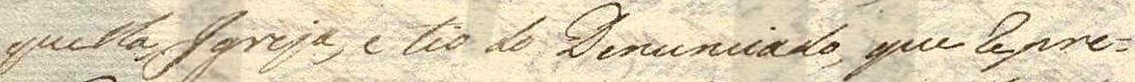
quella Jgreja, e tio do Denunciado, que Repre
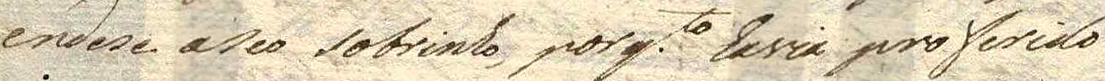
endese a seo sobrinho, porq.to havia proferido
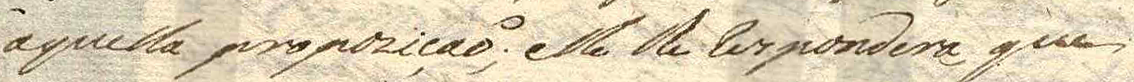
aquella propoziçaõ, elle lhe Respondera, que
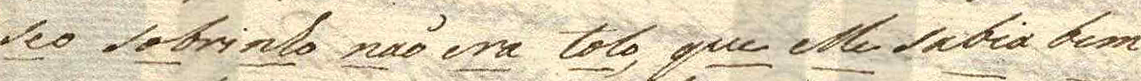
seo sobrinho naõ era tolo, que elle sabia bem
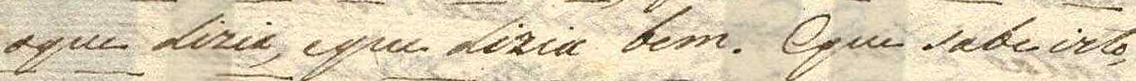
o que dizia, e que dizia bem. E que sabe isto,
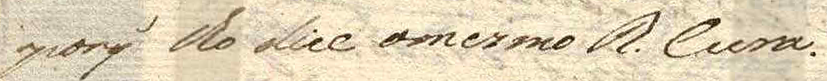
porq̄ lho dice o mezmo R. Cura.
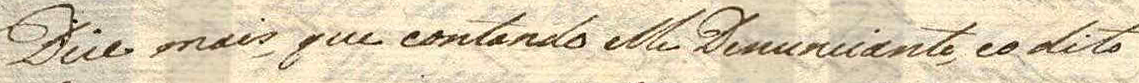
Dice mais, que contando elle Denunciante, e o dito
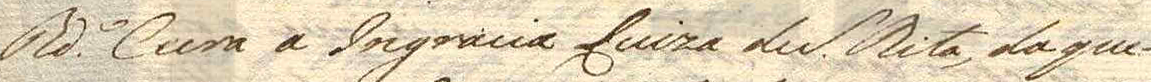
Rd.o Cura a Ingracia Luiza de S. Rita, daque
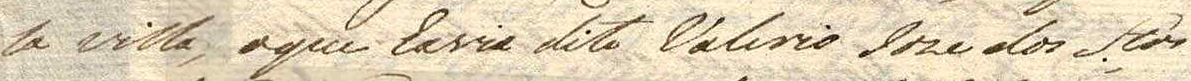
la villa, o que havia dito Valerio Ioze dos S.tos
